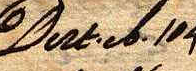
Dert. e b. 104
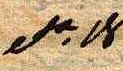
cta. 18
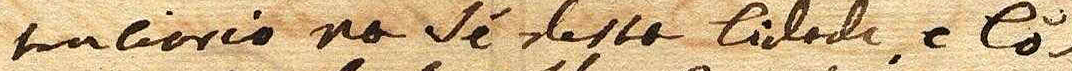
tenciario na Sé desta Cidade, e Cō
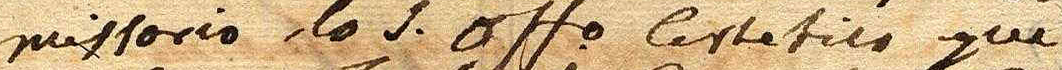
missario do S. Off.o Certefico que
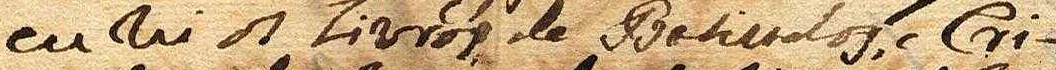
eu vi os Livros de Batizados, e Cri
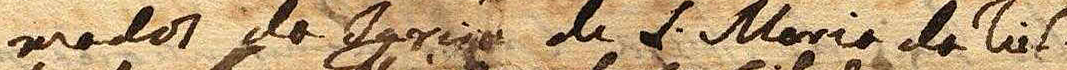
mados da Igreja de S. Maria da Vil
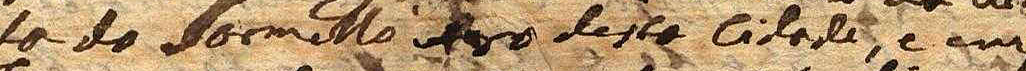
la do Iarmello Aro desta Cidade, e em
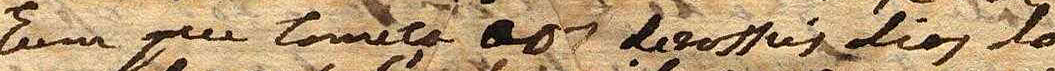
hum que Começa aos dezesseis dias do
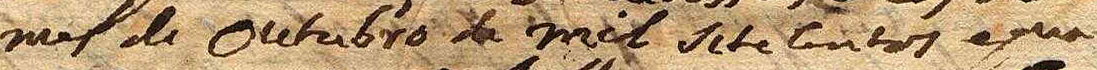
mes de Outubro de mil setecentos e qua
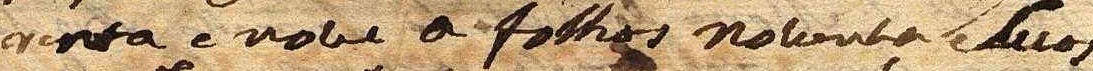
renta e nove a folhas noventa e duas
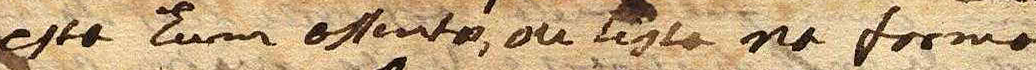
esta hum assento, ou lista na forma
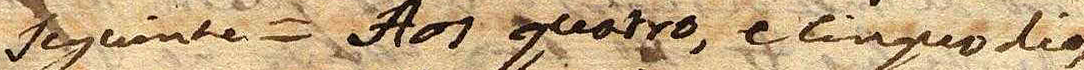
seguinte = Aos quatro, e cinquo dias
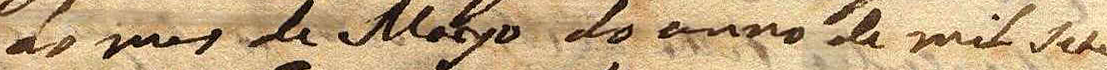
do mes de Mayo do anno de mil sete
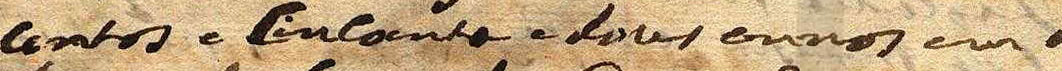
centos e Cincoenta e dous annos em a
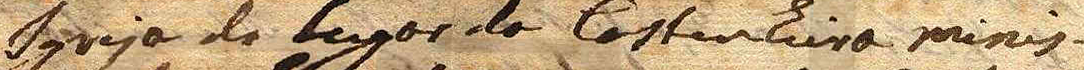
Igreja do Lugar da Castenheira minis
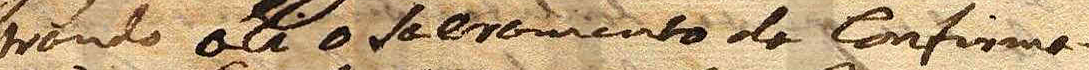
trando ahi o sacramento da Confirma
